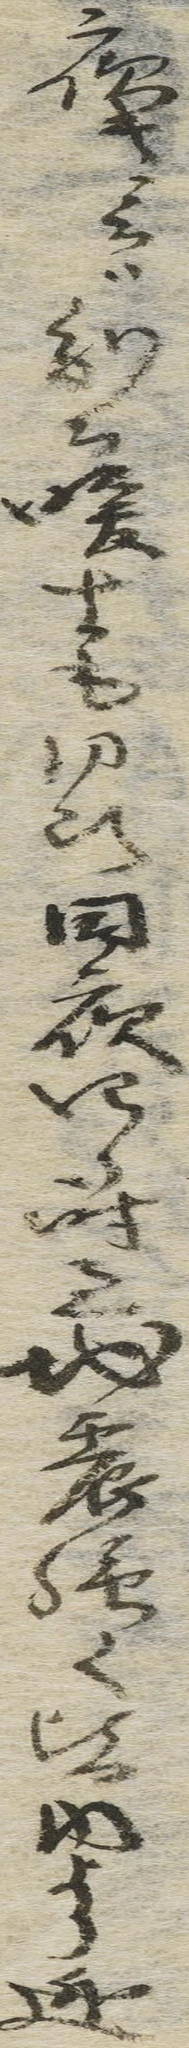夜キ二而ハ別而暖十日も同断同夜四ッ時過地震強く皆内より逃
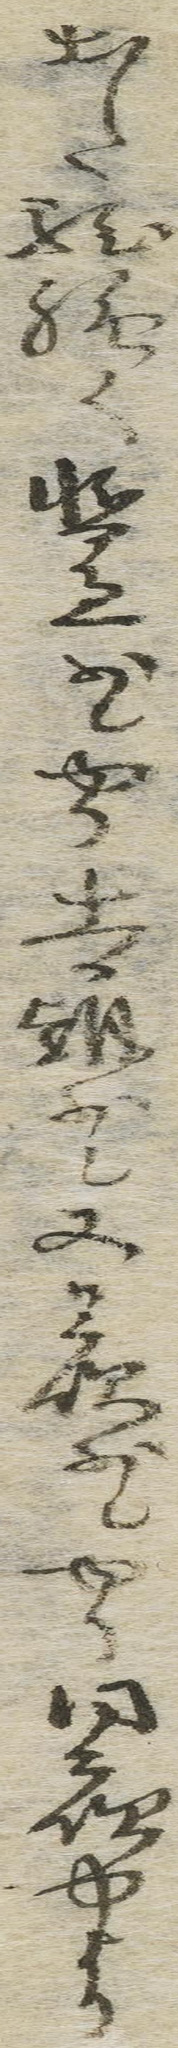出した程強く暫過少しゆり十一日朝少し又候夜少しゆり同夜中より
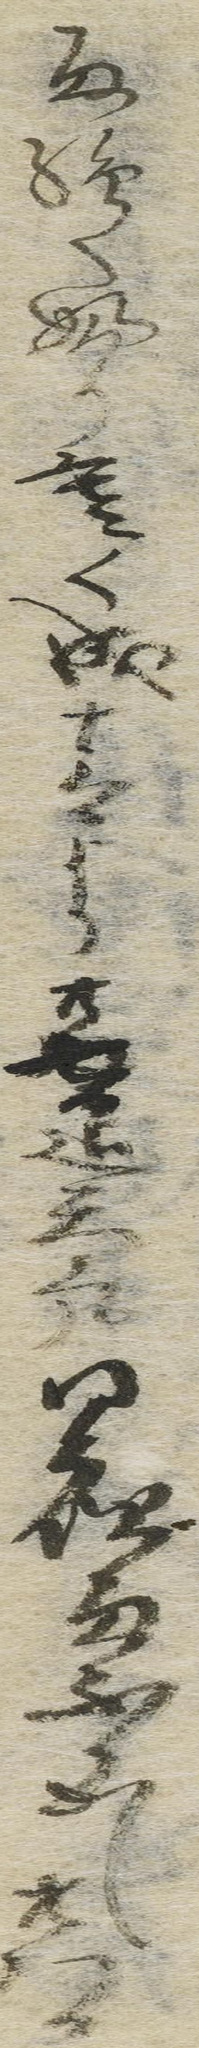雨強くふり寒く成十三日より廿五日迄天気同夜雨ふり出し廿八日
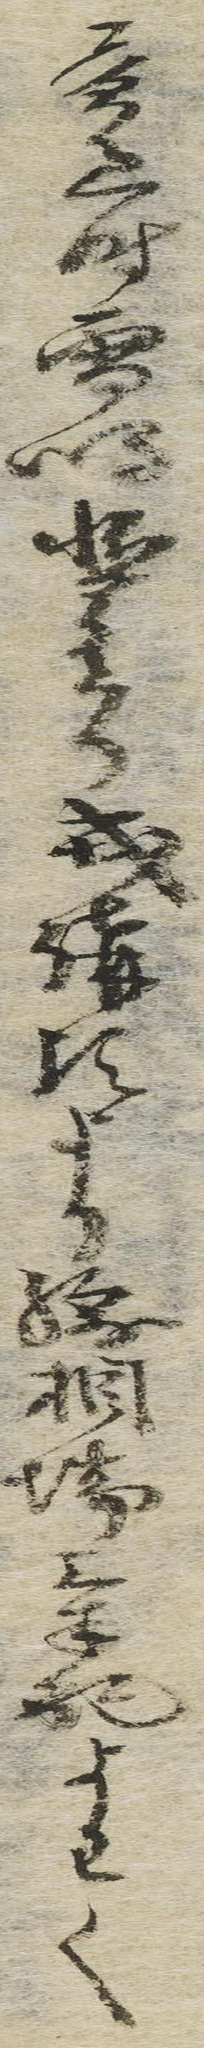昼過時雷鳴暫なり戎講頃より綿相場三本配より〳〵
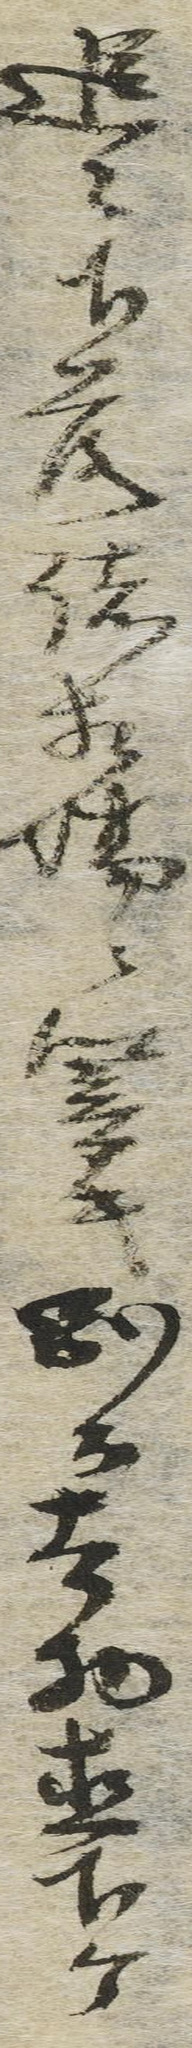追々下落諸相場二響キ別而太物直下ヶ
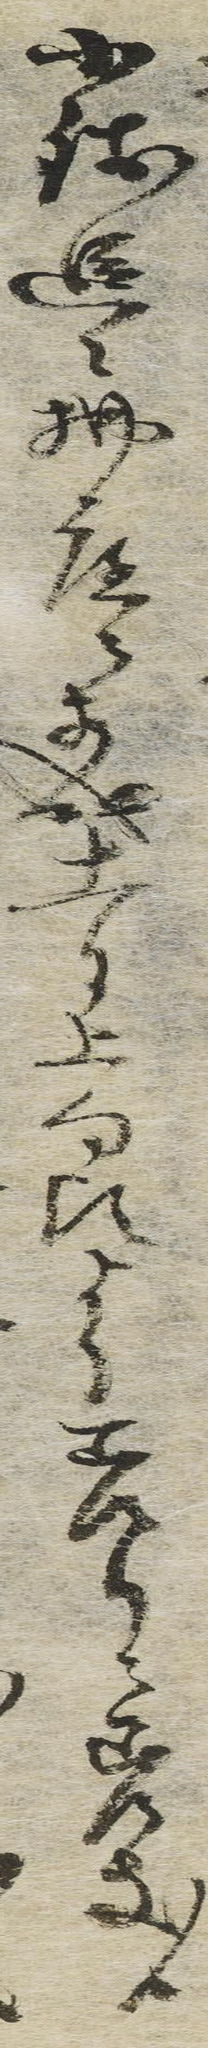小銭追々払底二相成十一月上旬頃より差引二差支候
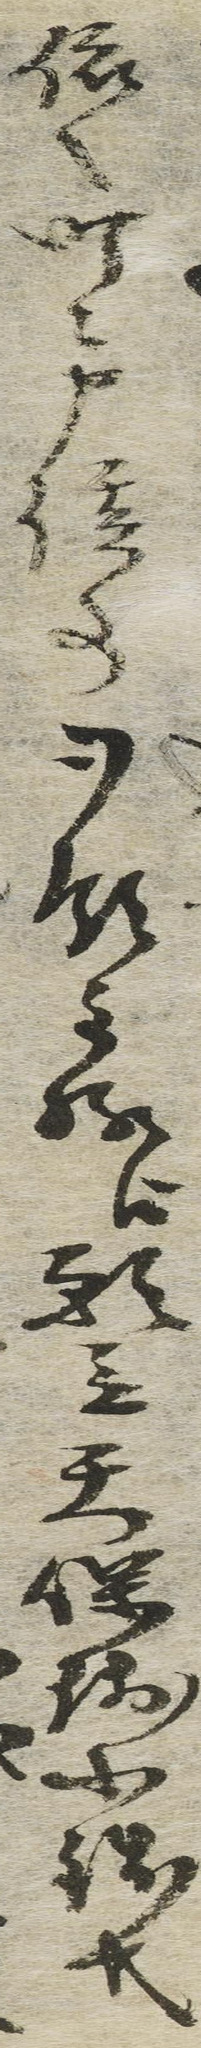依之町々申談事御領主様江願立天保銭小銭共
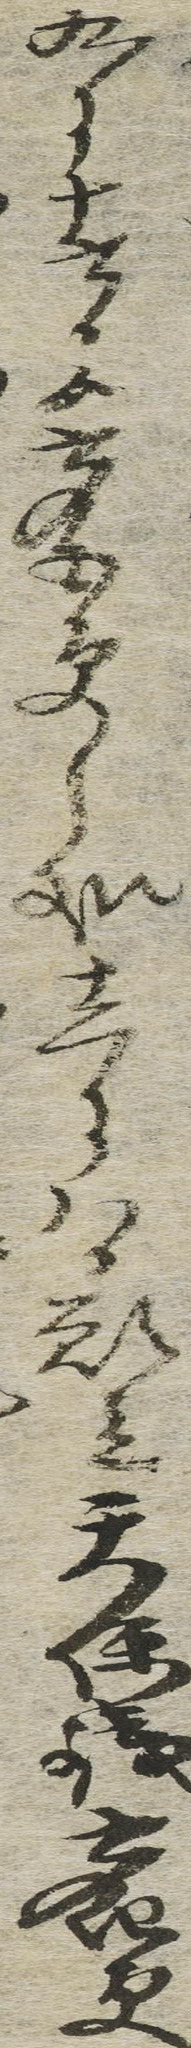九月十六日ゟ六貫五百文之処十二月八日願立天保銭六貫四百文
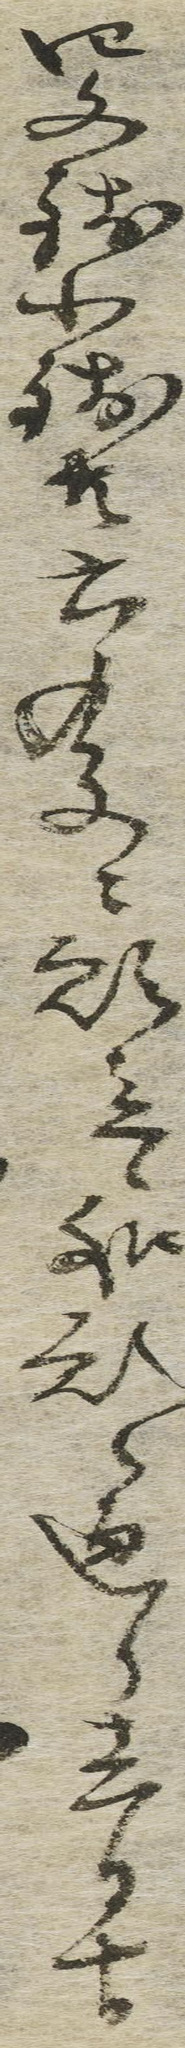四文銭小銭共六貫文二願立候処願之通り十二月十日
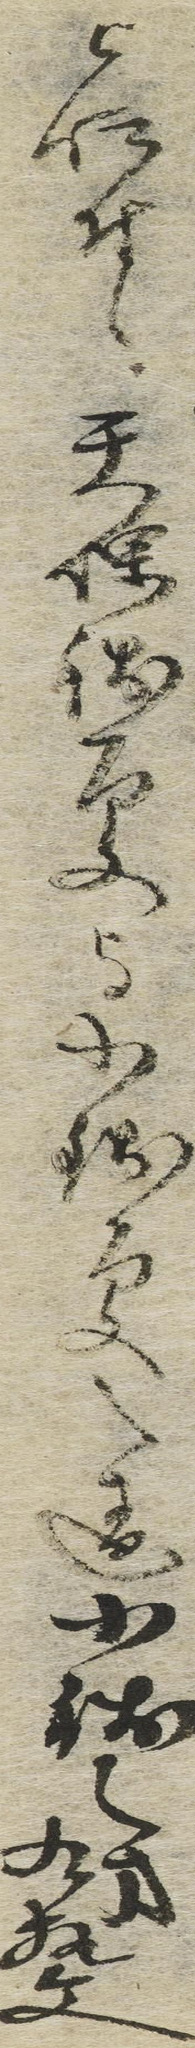被仰付候天保銭百文と小銭百文之違小銭之方九拾文

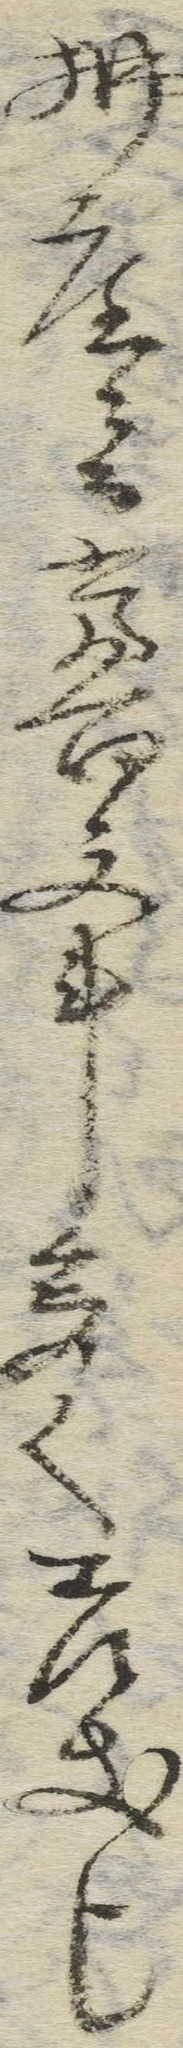払底二而当百文計多く差支申候
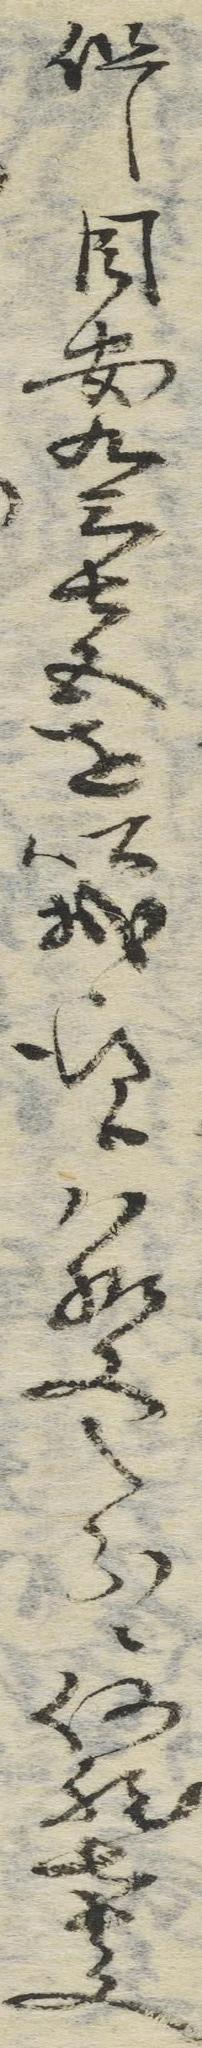但し目安九三七五を以掛候得ハ八拾文之分二何歟七十文
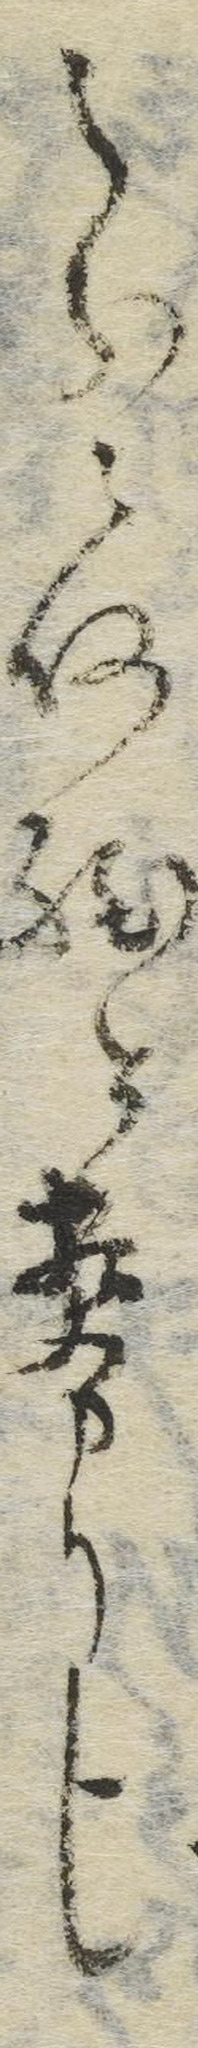之分二何程と相分り申候
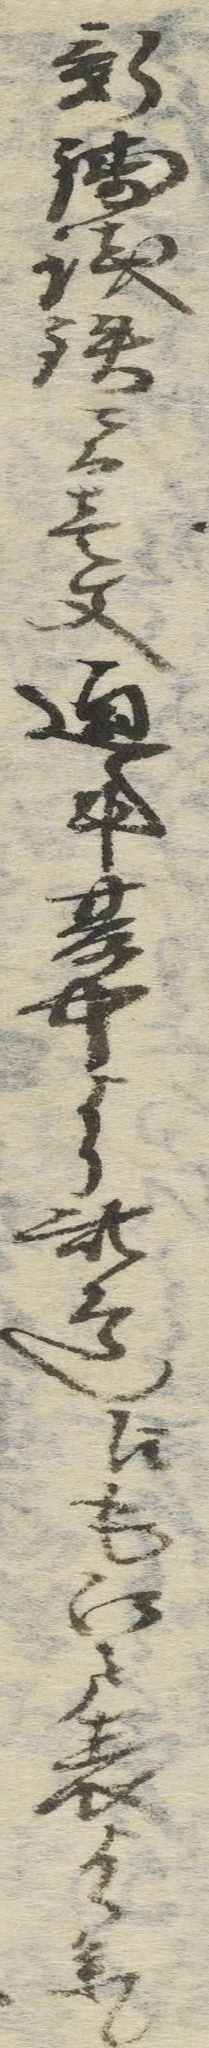新鋳銭鉄二而壱文通用夏中より此辺江も江戸表より参候
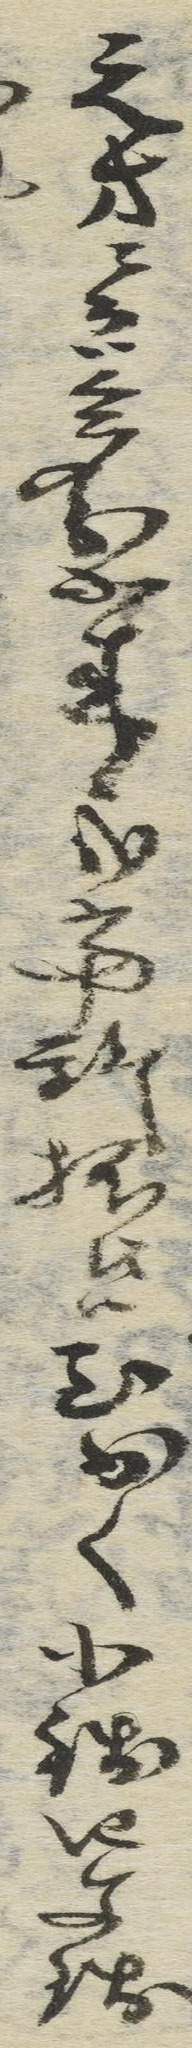元方二而ハ多分出来候哉当所抔江ハ至少く小銭四文銭
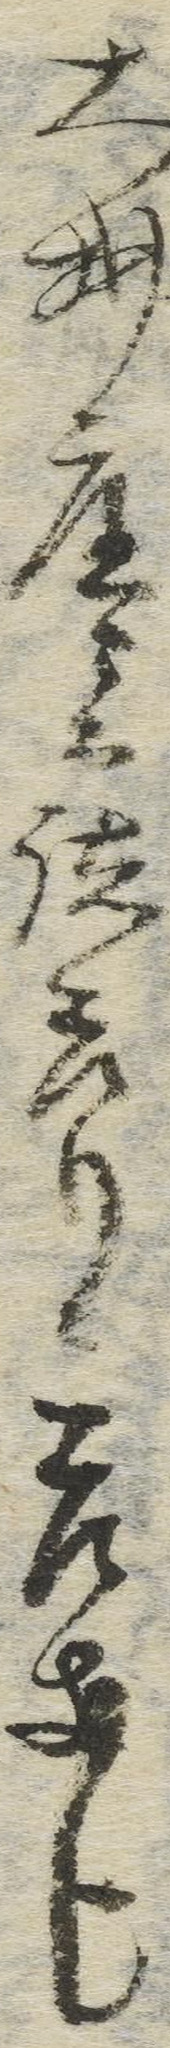大払底二而諸差引二差支申候
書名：信濃越後　地震書留
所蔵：東京大学地震研究所図書室 Earthquake Research Institute Library, The University of Tokyo, JAPAN
